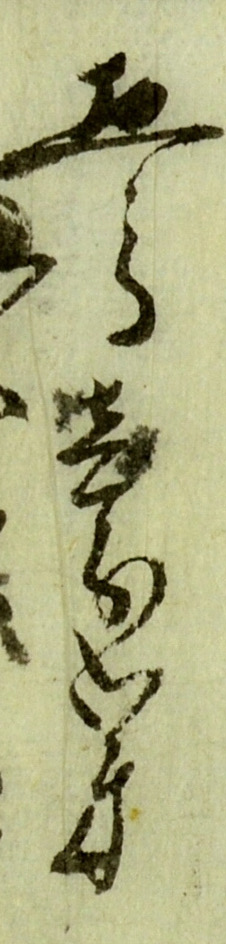惣高壱分弐朱
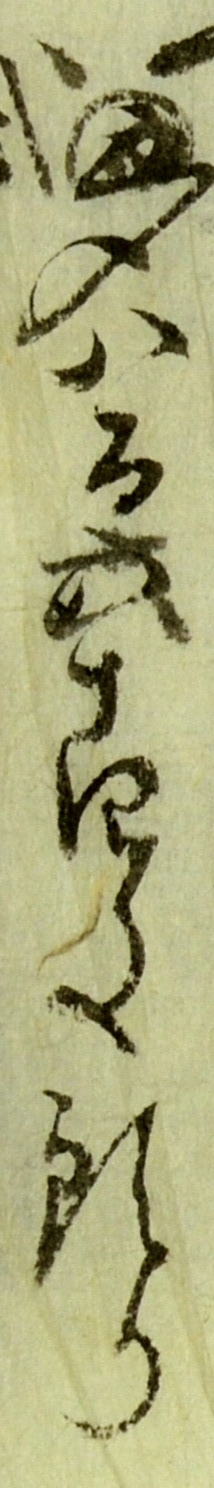弐〆八百六十四文預り

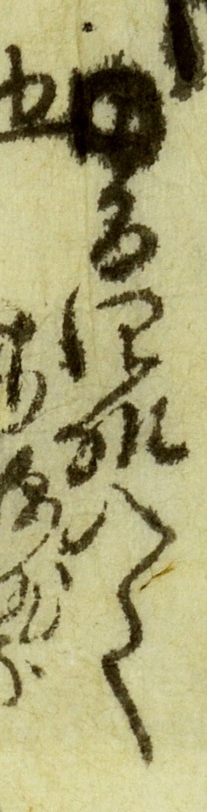五百四拾八文
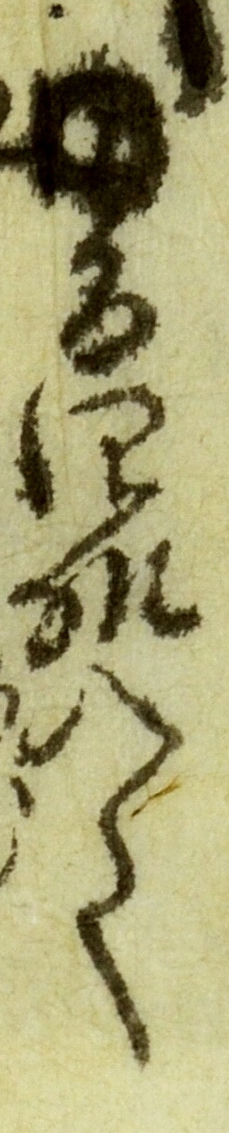五百四拾八文
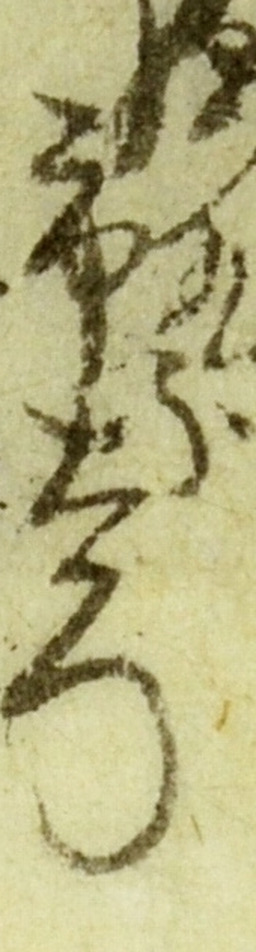市右衛門
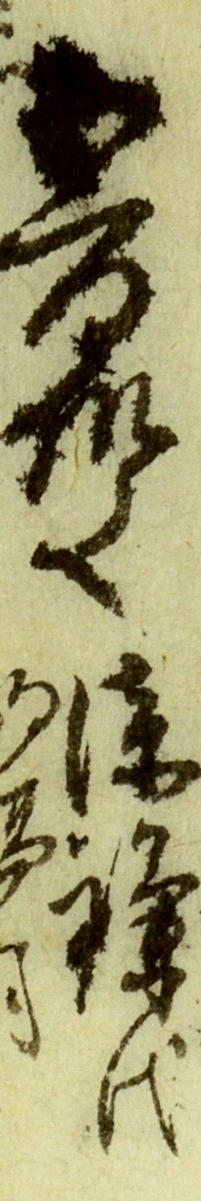五百拾文漆鎌代
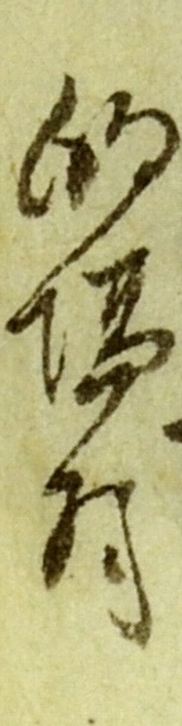的場村
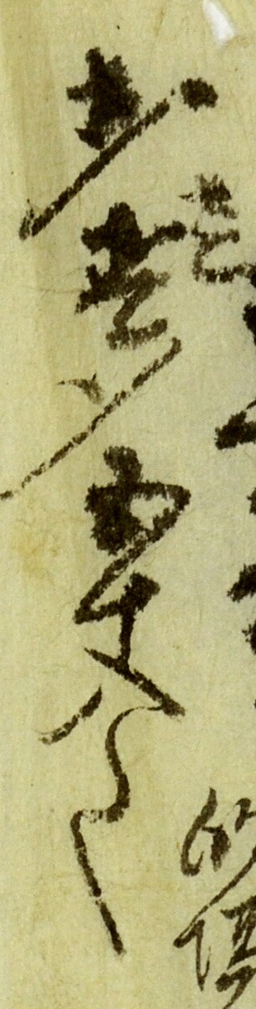惣〆壱〆五十八文
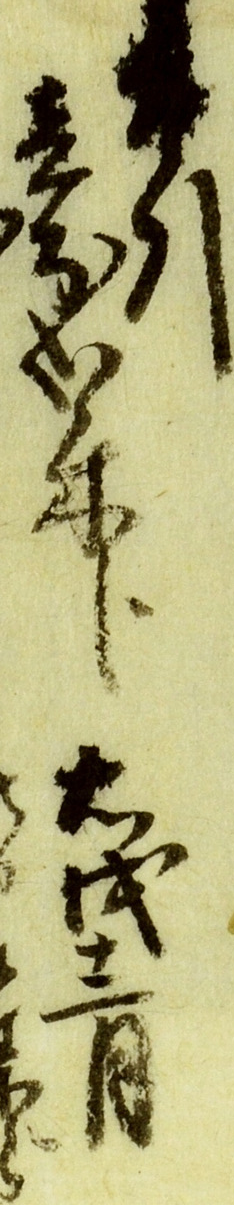壱分弐朱ト右戌十二月
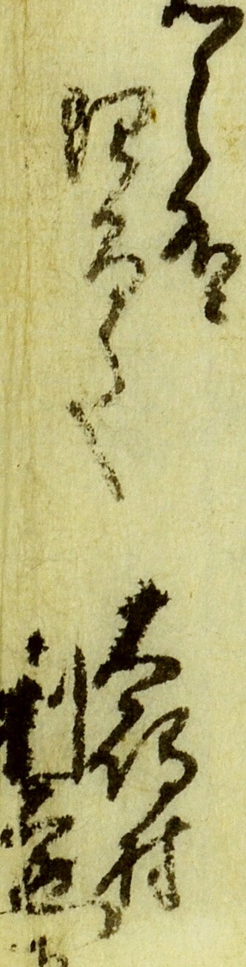四百文大島村
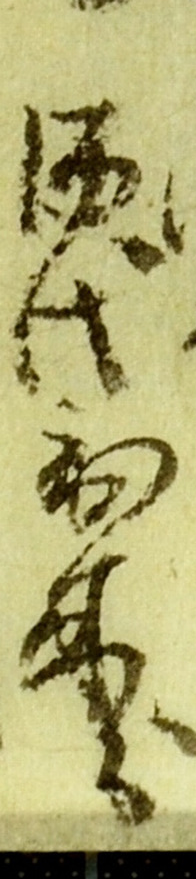酒代到来分
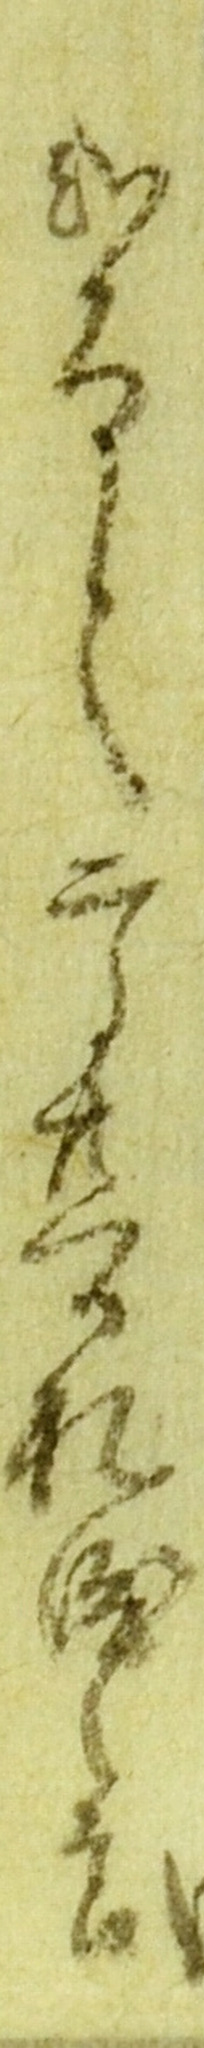弐百文二月廿一日札渡之節

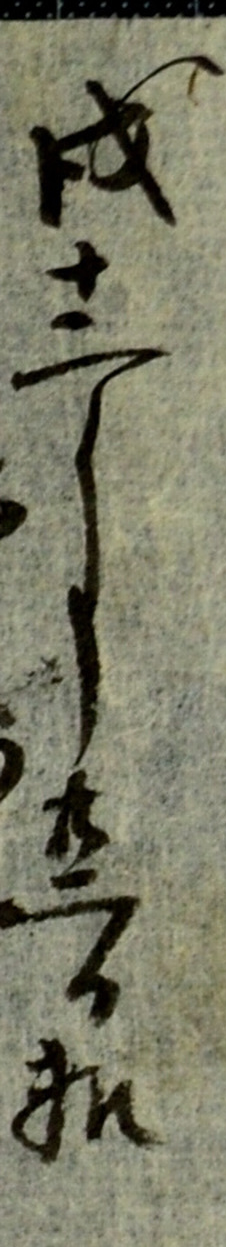戌十二月廿二日扣
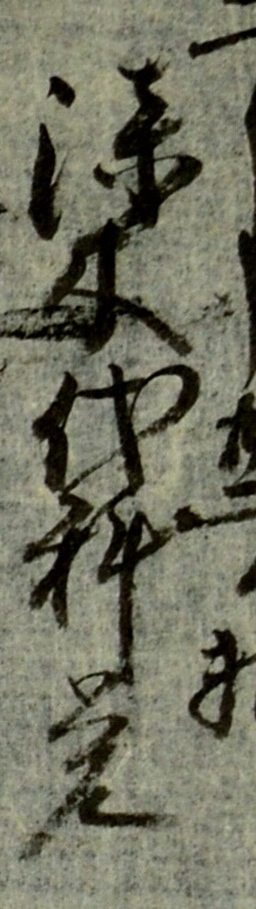漆木代料覚
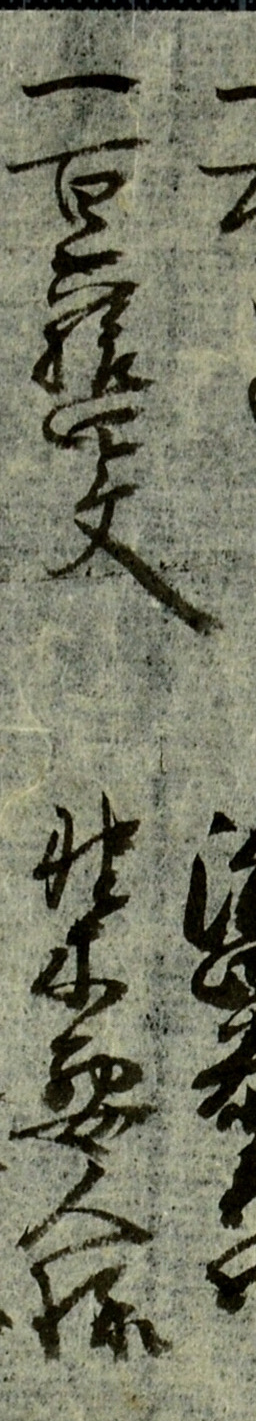一百六拾四文野木要人様

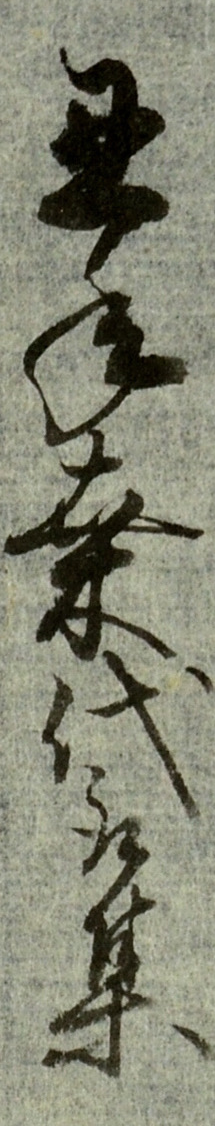丑年桑代取集
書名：覚
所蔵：伊那市立高遠町図書館・合同会社AMANE
